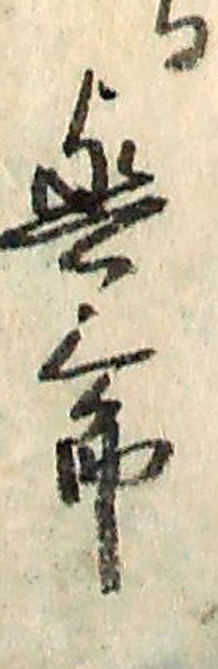与三郎

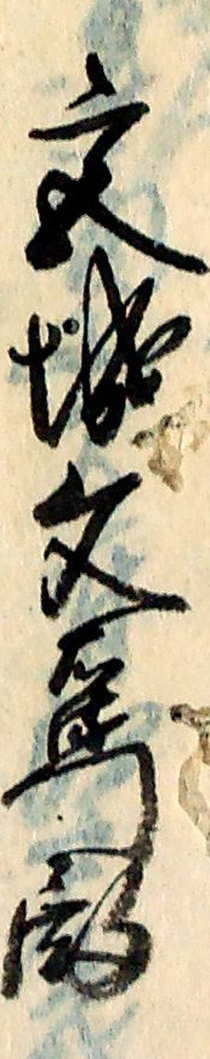宮城文右衛門殿
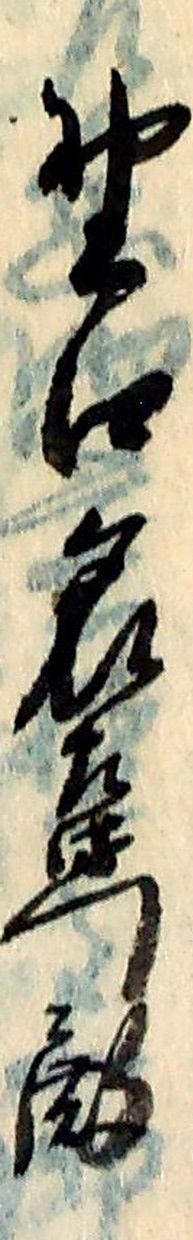野口名左衛門殿
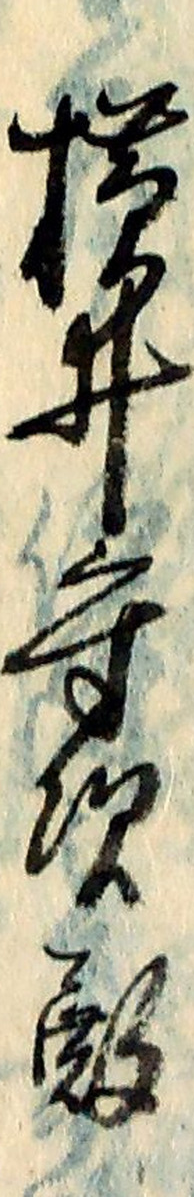横井守次殿
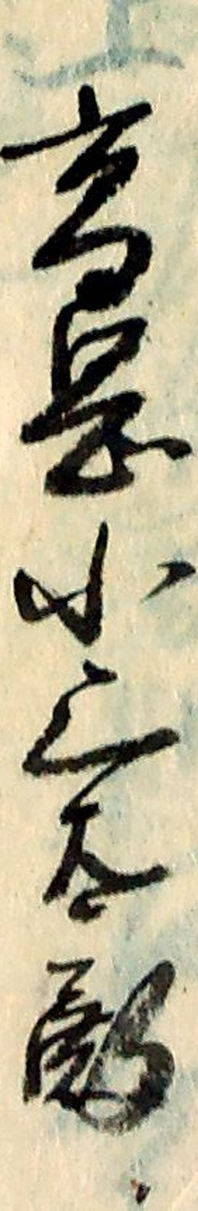高岡小三太殿

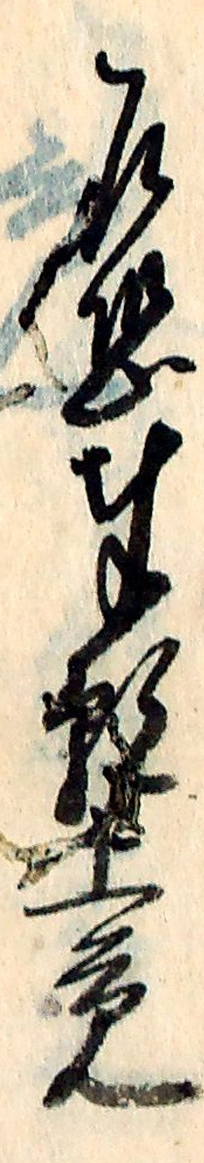乍恐奉願上覚
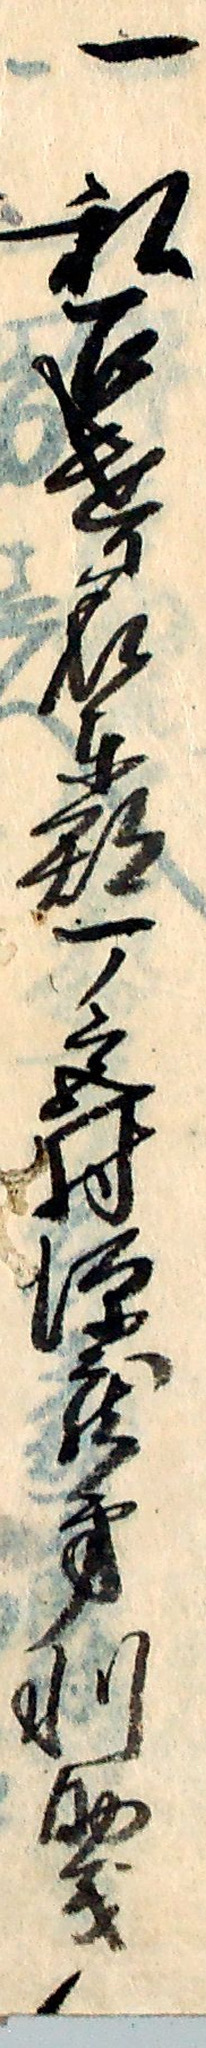一私召遣い名東郡一ノ宮村源蔵弟利助義
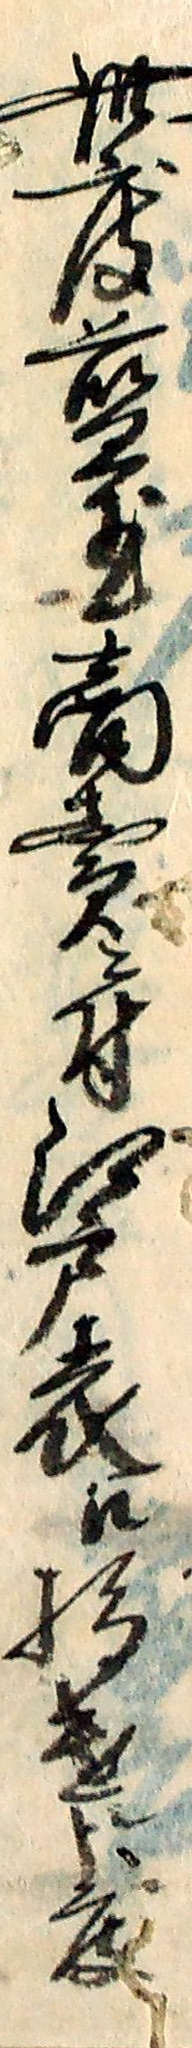此度藍玉商売に付江戸表え指遣し申度
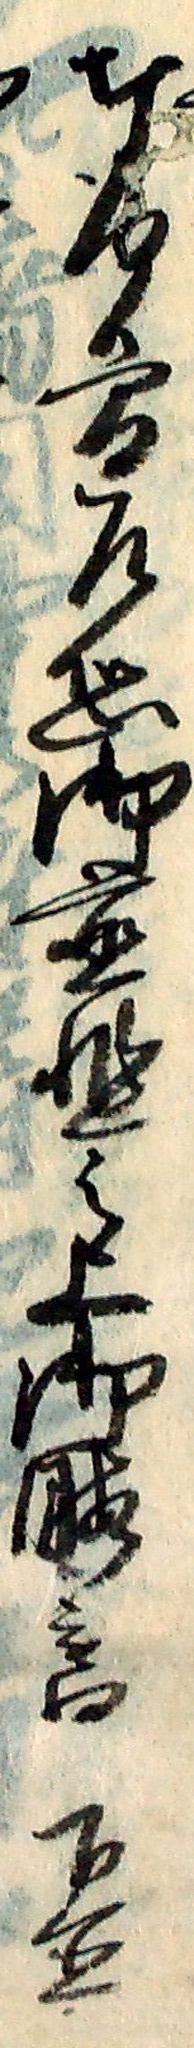奉存候間乍恐御慈悲之上御暇被為下置
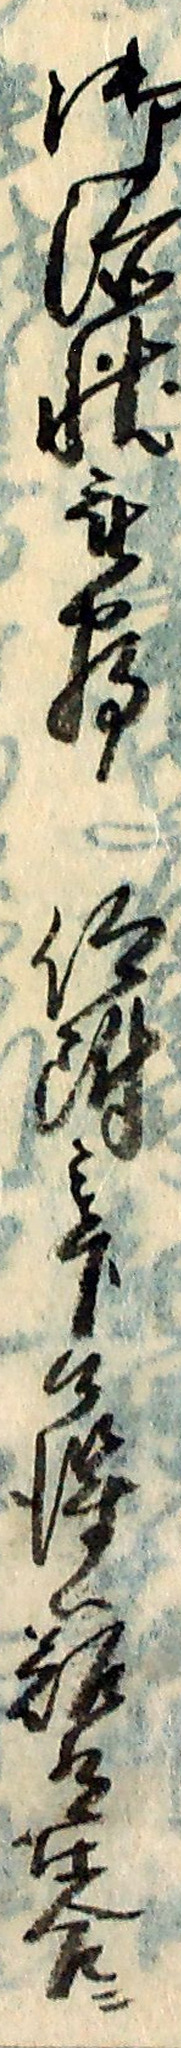御添状被為仰附被下候得は難有仕合に
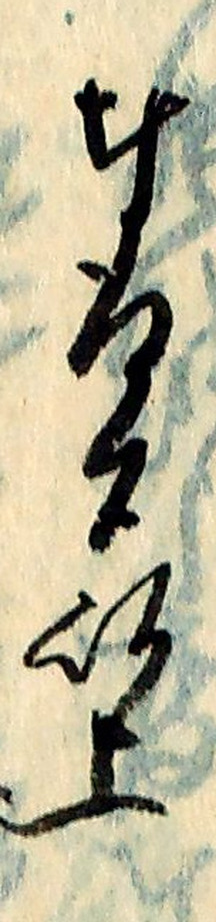奉存候以上
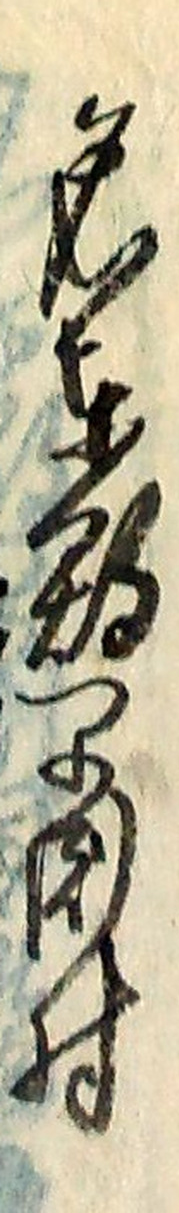名東郡早淵村
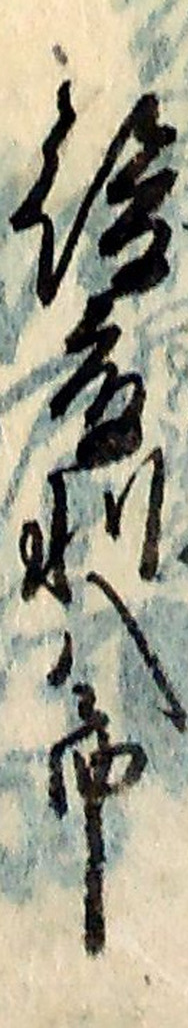後藤利八郎
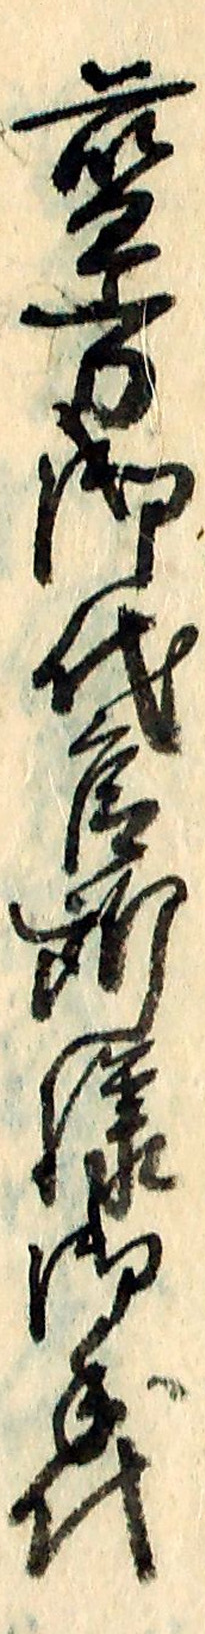藍方御代官所様御手代
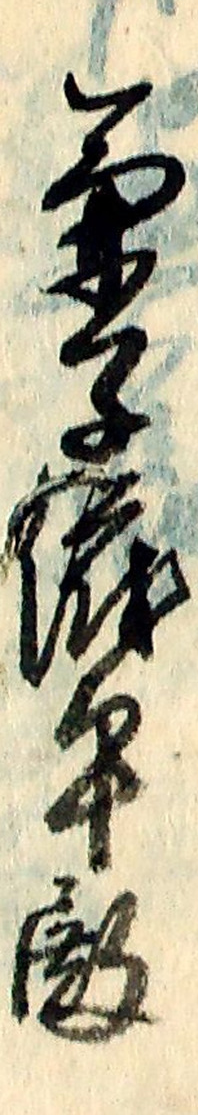兼子儀平殿

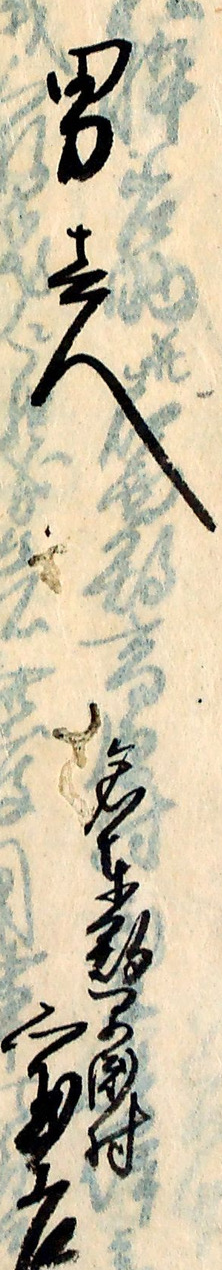一男壱人名東郡早淵村
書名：諸御願書控(後藤氏壱番）
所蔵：鳴門教育大学 Naruto University of Education
